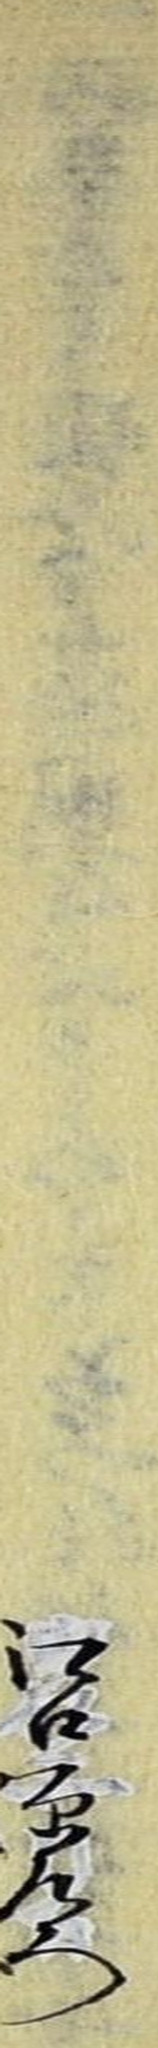江口源左衛門
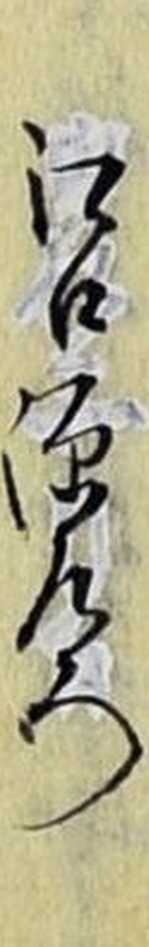江口源左衛門
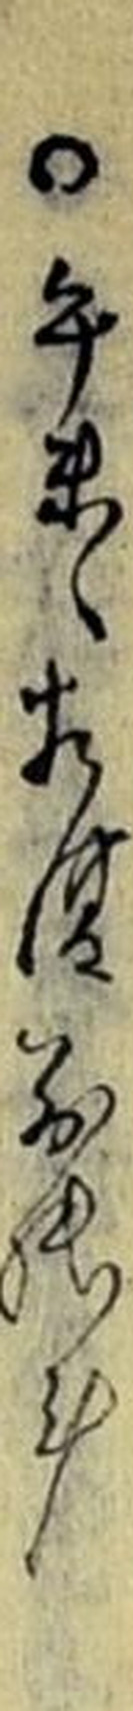○午未へ相復別紙斗
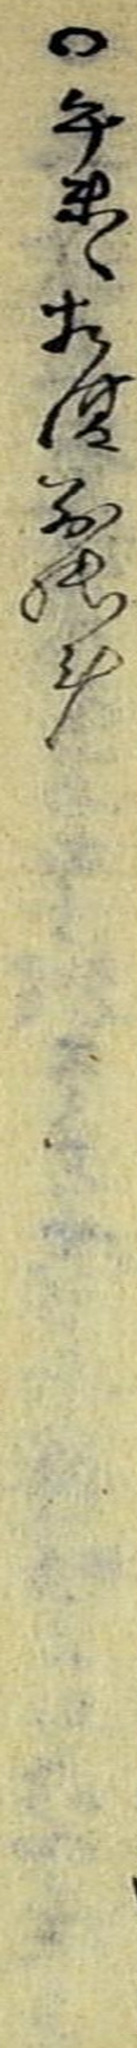○午未へ相復別紙斗
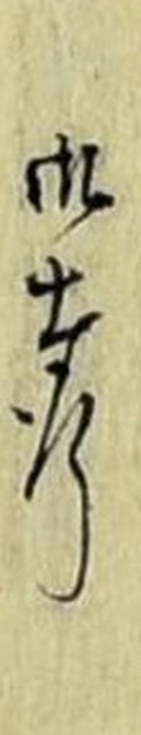御奉行
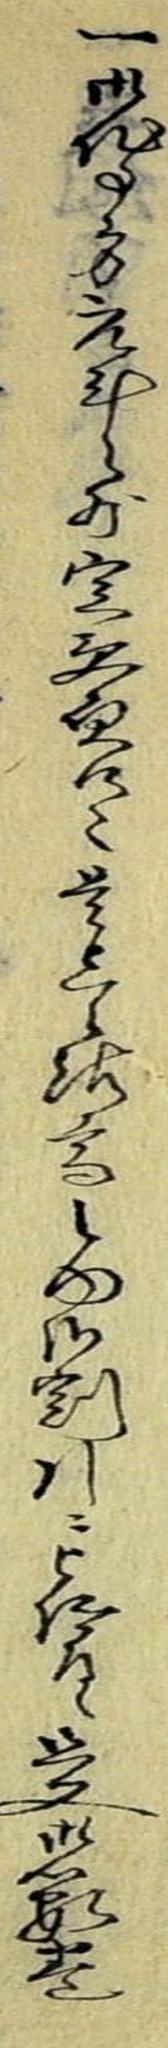一御作事方取斗之外定受負口々是迄之銀高之内弐割引に被仰付候且又御藪巻
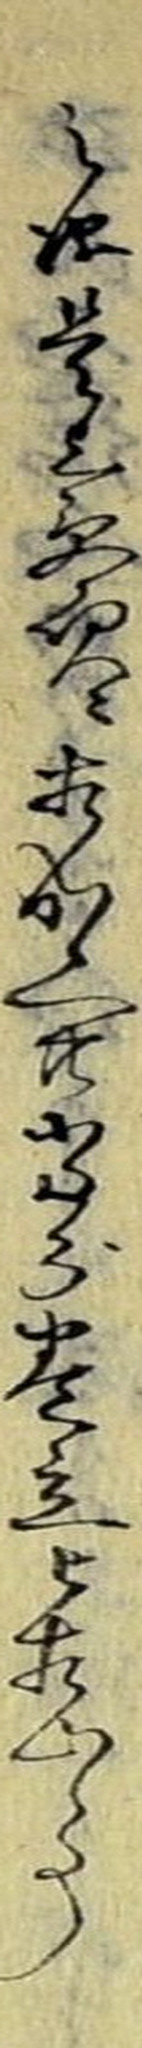之儀是迄受負に相成候へ共当分巻立被相止候事
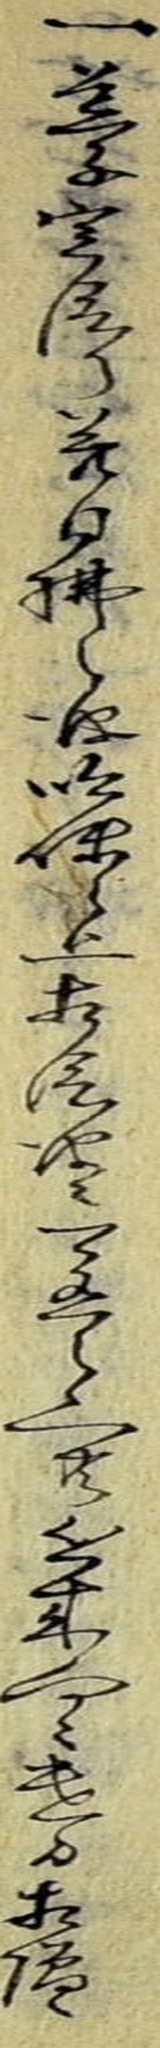一荒子定渡り并日払之儀吟味之上相渡儀に可有之候へ共近来向々遣形相増候
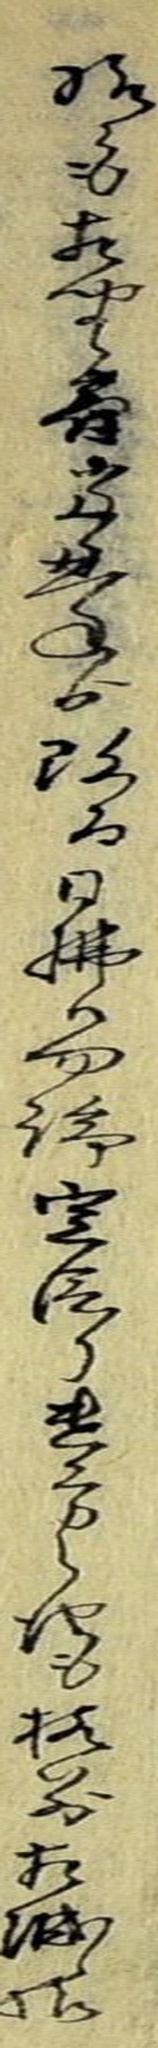様にも相聞候間当丑年ゟ改而日払は勿論定渡り遣方之儀も格別相減候様
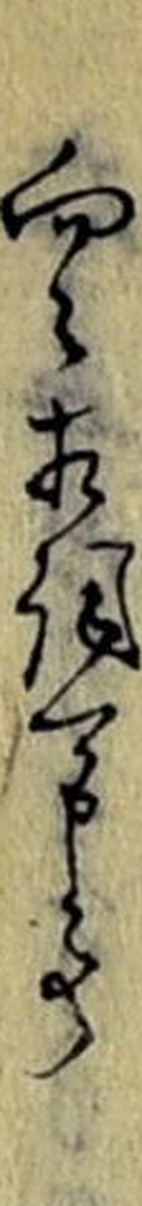向々相調可申事
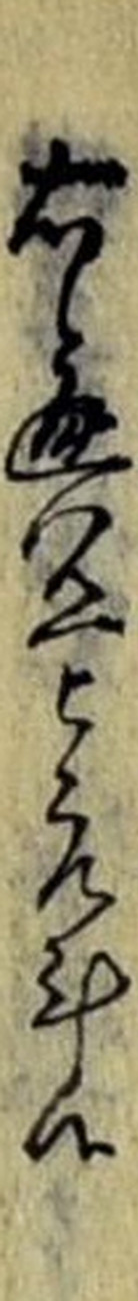右之通宜被取斗候
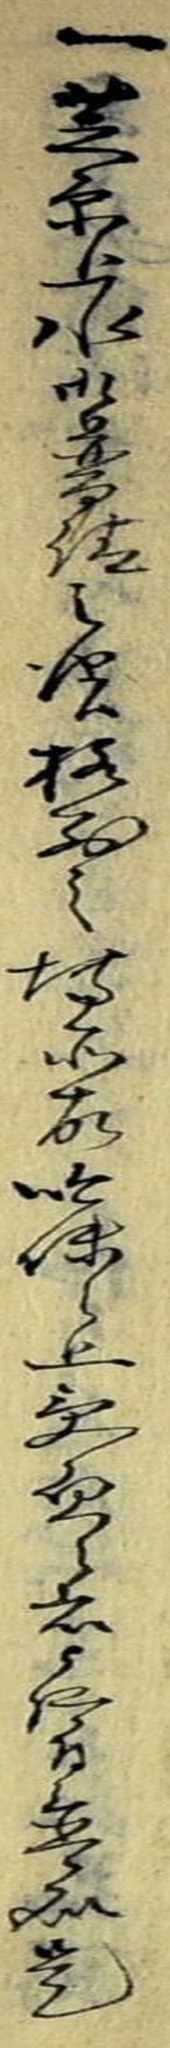一芝原上水御普請之儀は格別之場所故吟味之上受負之者被仰付置候処是

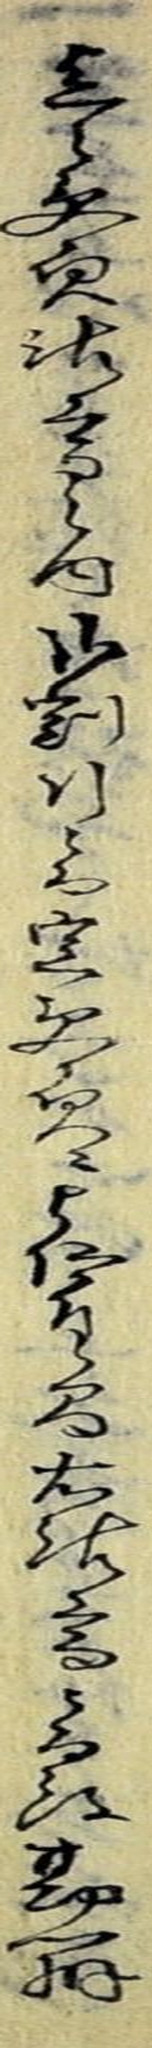迄之受負銀高之内弐割引に而定受負に被仰付候間右銀高に而致勘弁
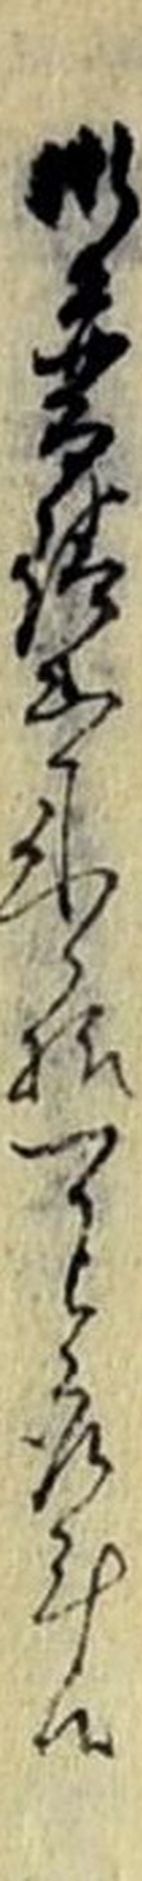御普請出来候様可被取斗候
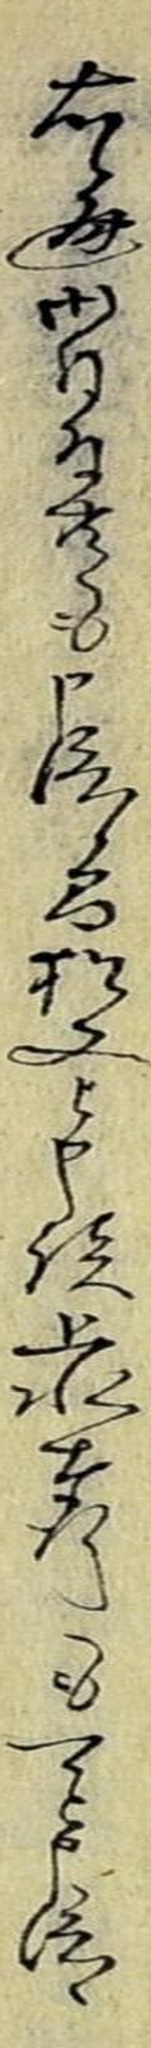右之通御目付共へも申渡候間猶又被申談上水奉行へも可被申渡候
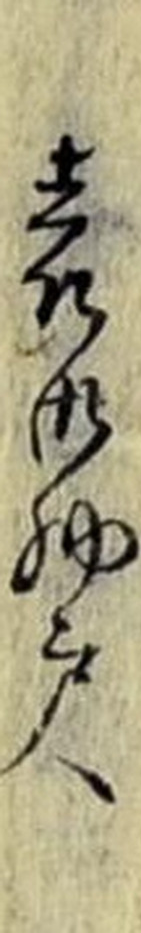表御納戸へ
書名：命令之部 四
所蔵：福井県文書館 Fukui Prefectural Archives
